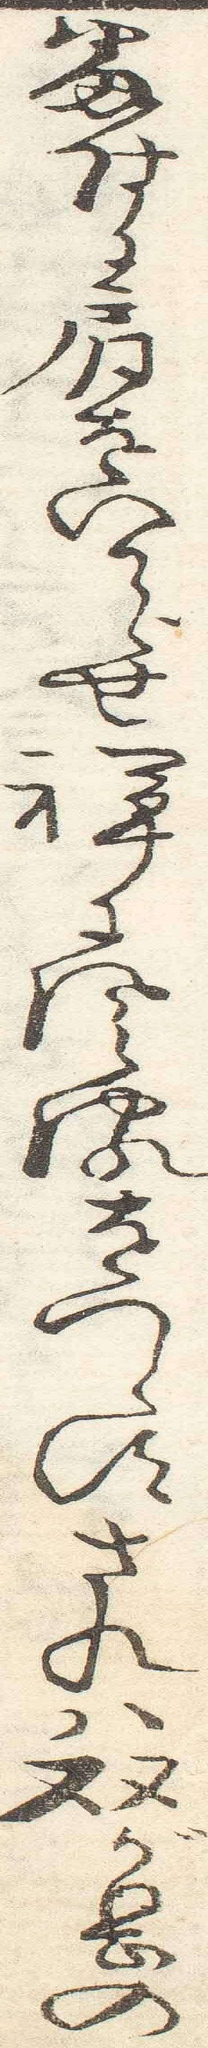番付に肩をいからせ褌に風流をつくす、されは双が岡の
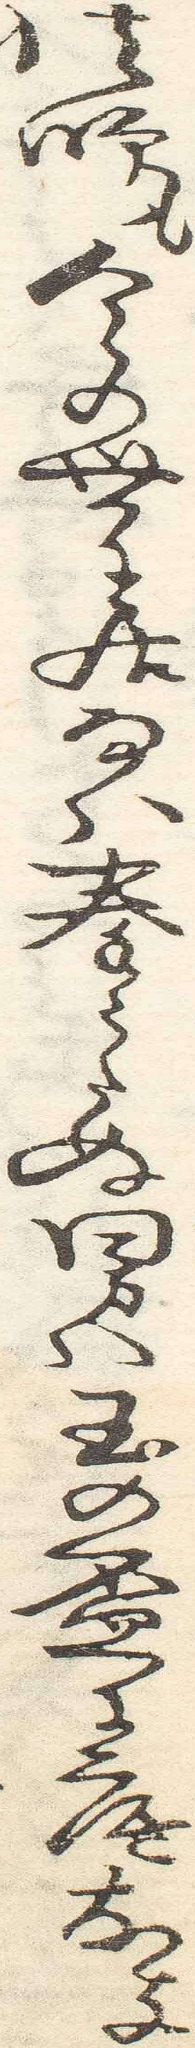法師も今の世に居なは、拳うたぬ男は玉の盃に底なき
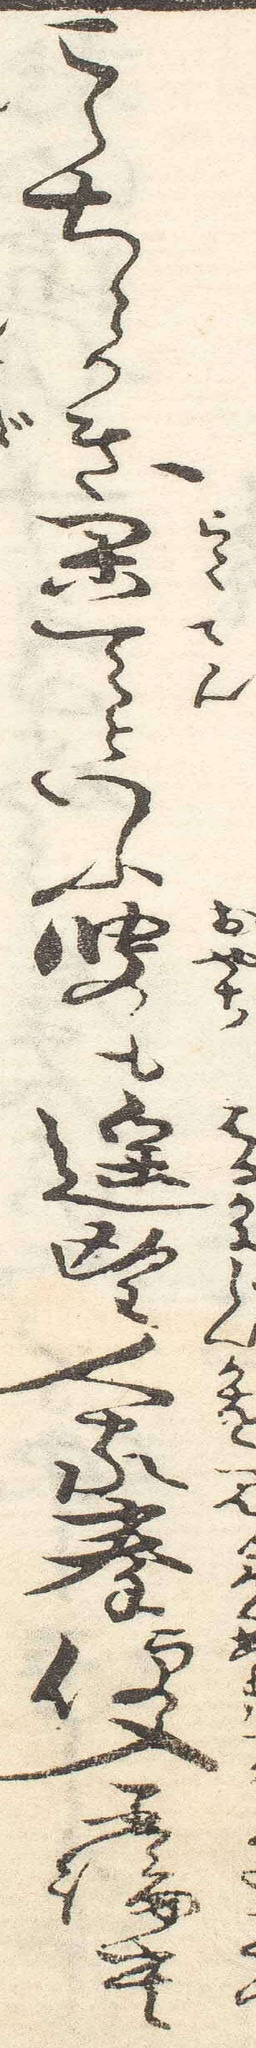こゝちとかき、楽天といふ叟も遥望人家拳便入不論貴
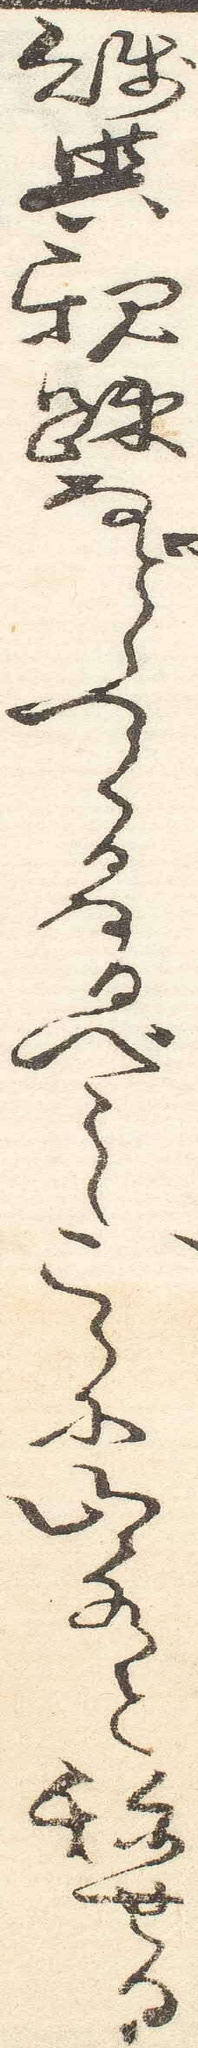賤与親疎、などゝつくるなるべし、こゝに山水と称せる
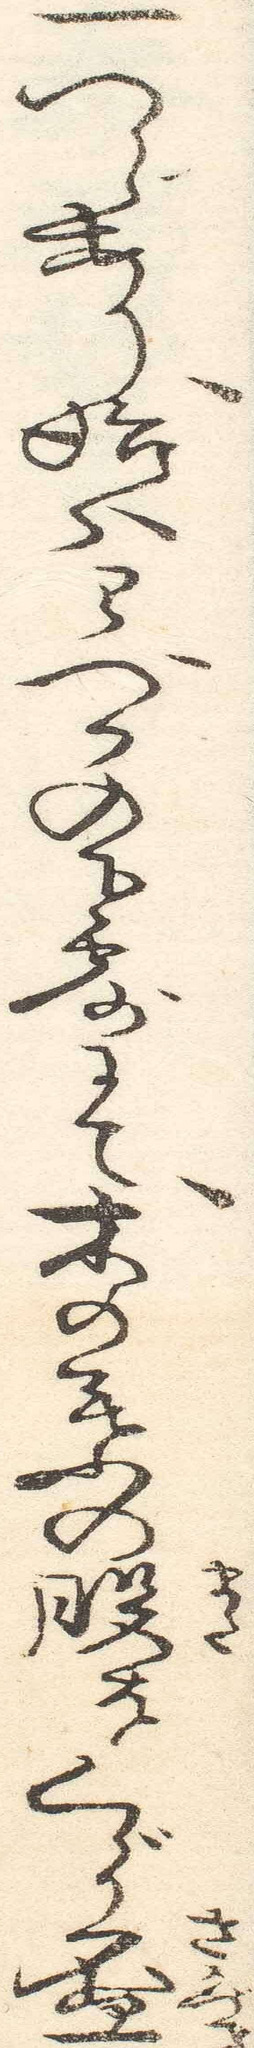一つらあり、始はわづかの下露にて、木の葉の股をくゞり盃
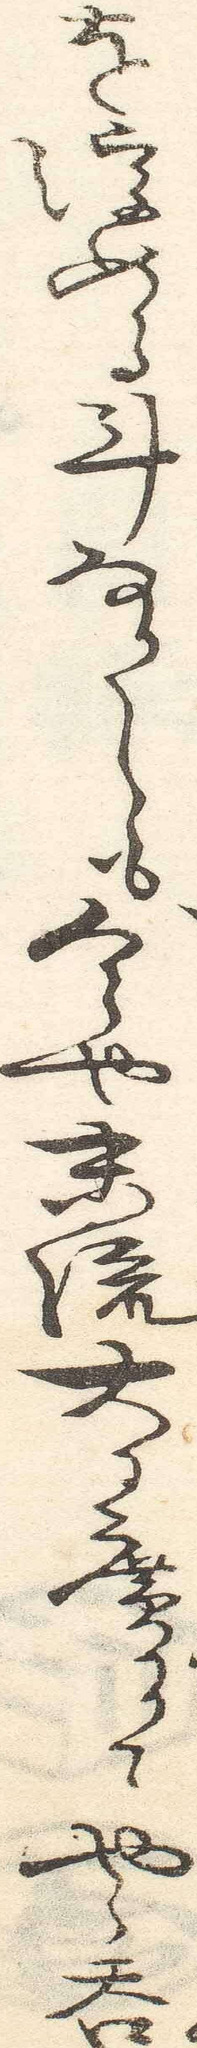浮める斗なりしも、今や末流大に広がりてやゝ呑
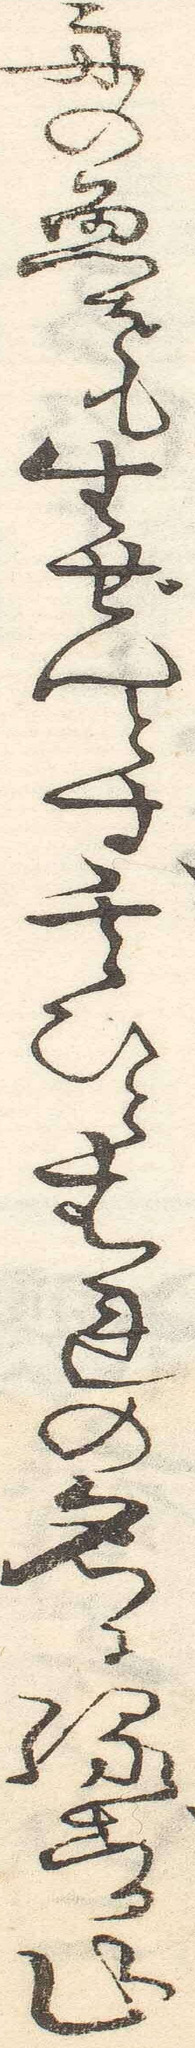舟の魚をも生ぜんとす、其ひとむれの名に縁ある、山
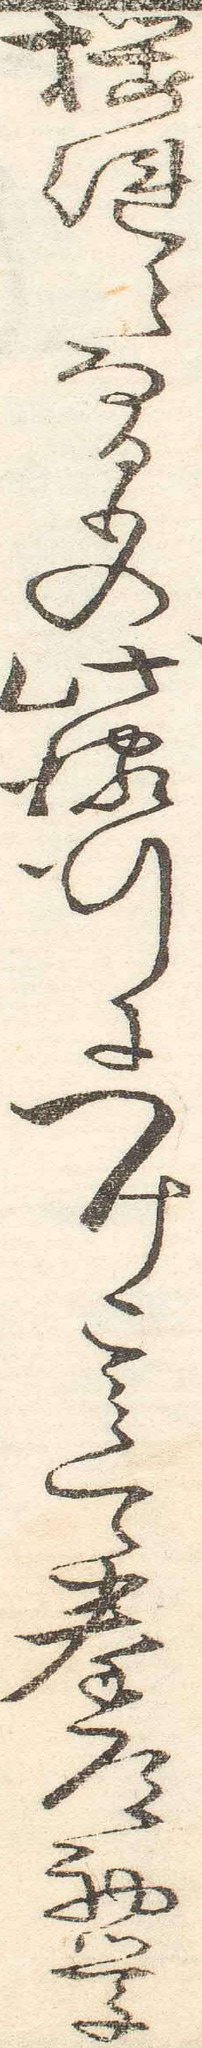桜漣々なるもの、此流行につけこみて拳道初学
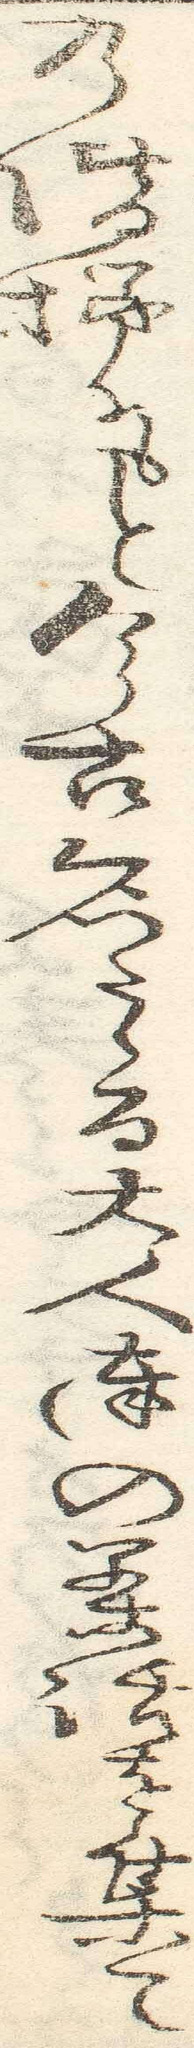の階梯にもと、今古名たゝる大人達の茶話を集て、
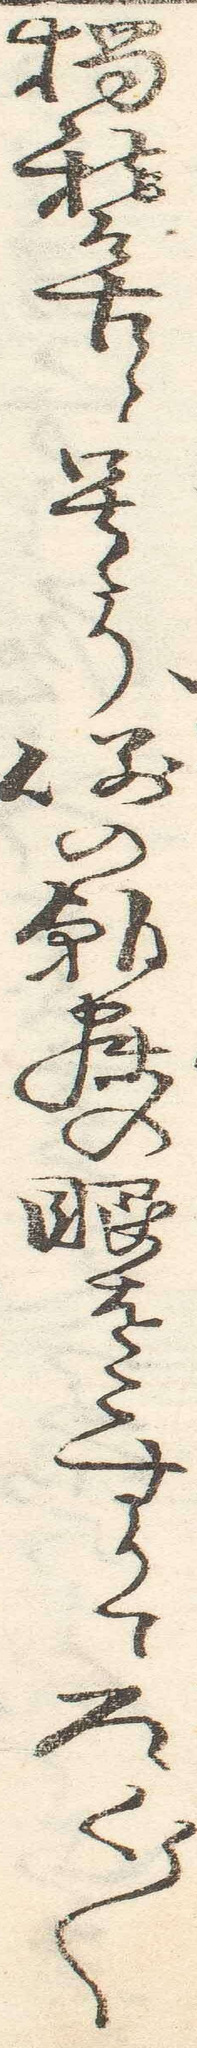独稽古と号たり、例の朝寐の眼をこすりて、ろく〳〵
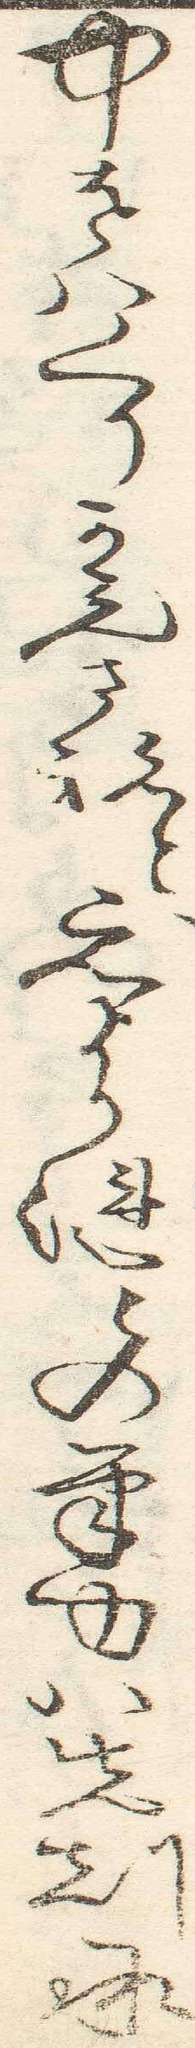中をはくりかえさねど、えより漣々の筆力は、先刻承
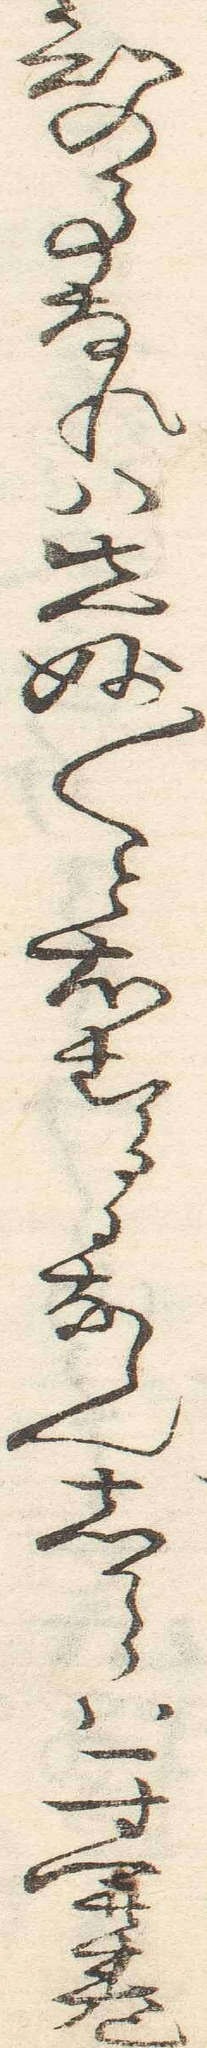知の事なれは先妙〳〵とうむるるならん、しからは一寸開巻

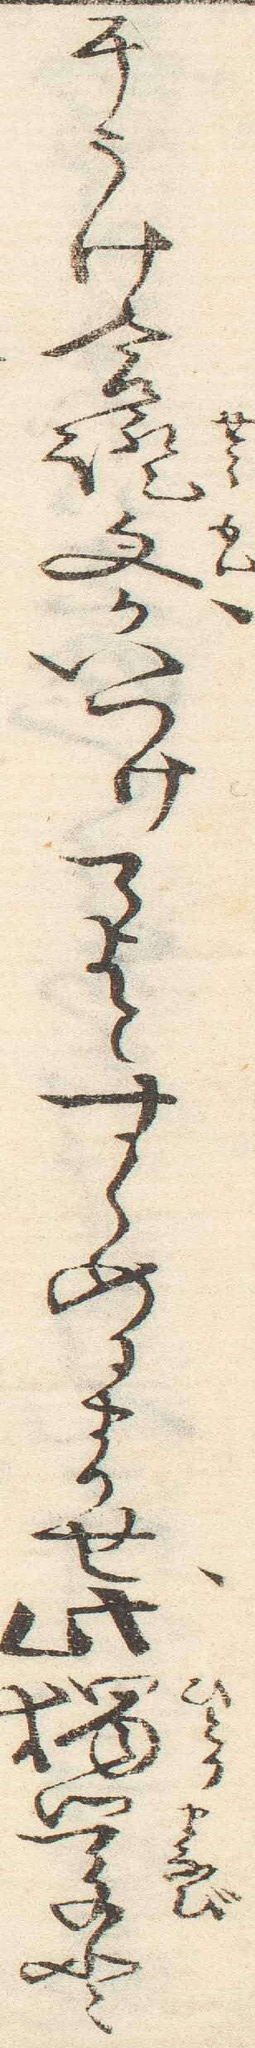にうけ合証文、かいつけてよとすゝめにまかせ、此独学と
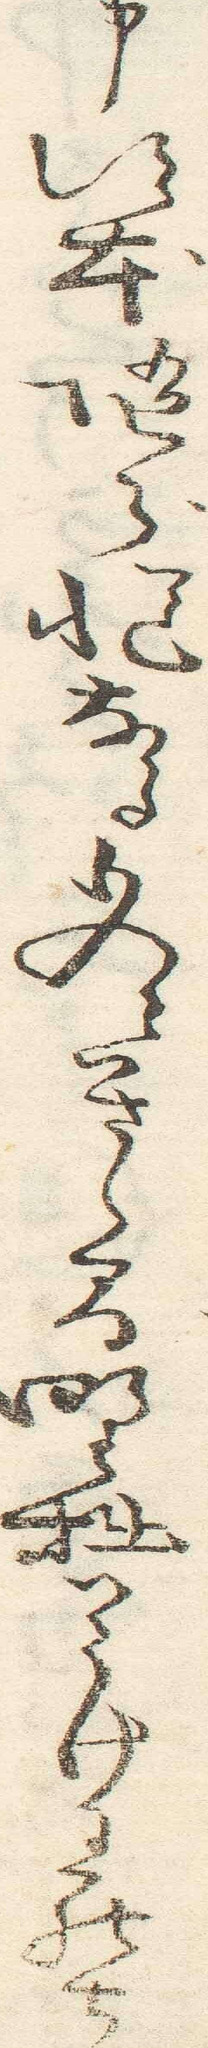申す本、随分慥なるものに御さ候間、野拙御うけに罷立、
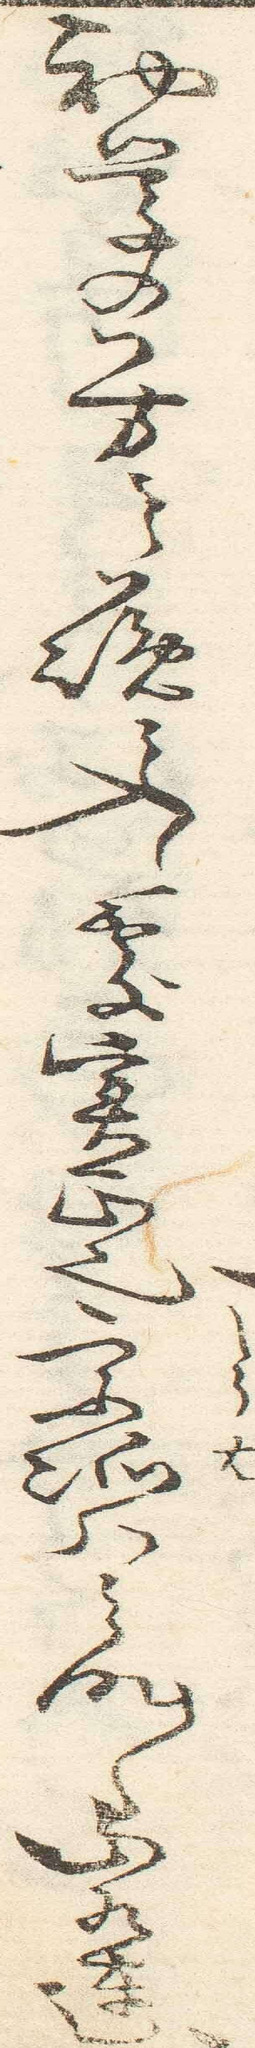初学の御方々に御覧に入候処実正也、宗派はみな〳〵山水達、
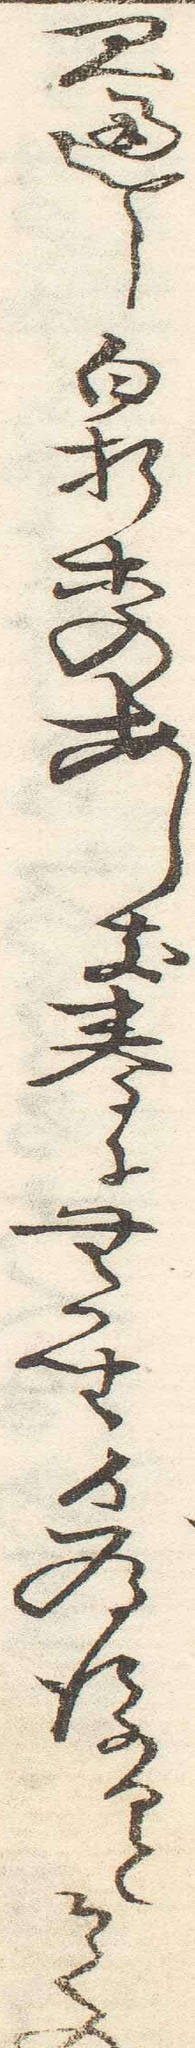見通し白折等のあしき拳に無御坐候、為後日とかくの
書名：拳独稽古
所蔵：東京学芸大学附属図書館 国文学研究資料館
